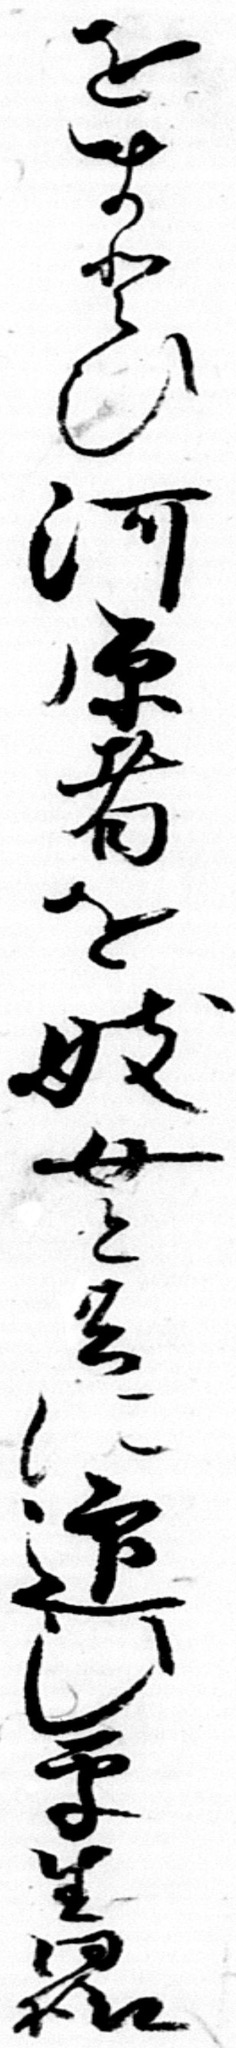をまとひ河原者を妓女と共に迎ひ平生同様
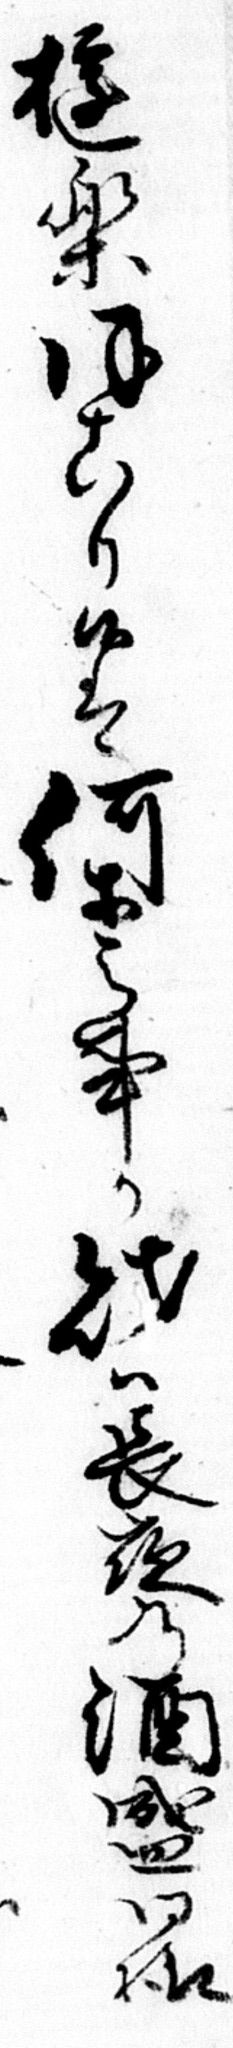遊楽ほこり候は何等之事か財は長夜の酒盛同様
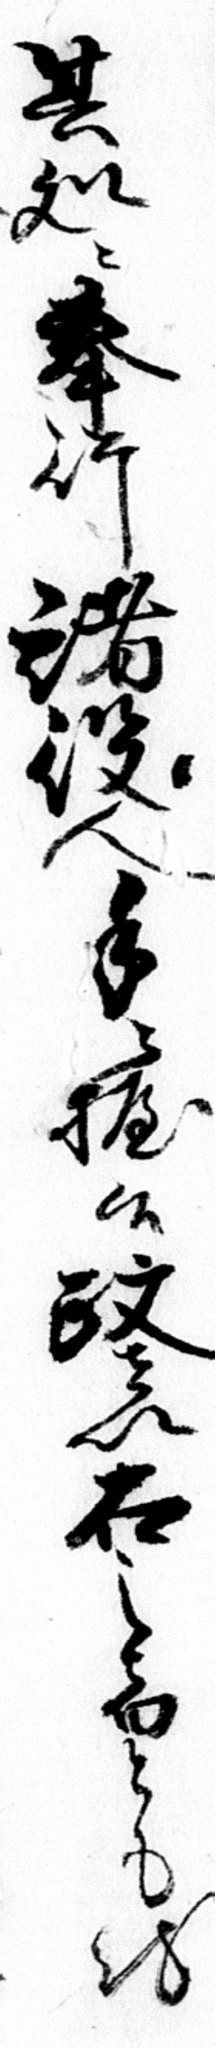其処に奉行諸役人手に握候政を以右之者ともを
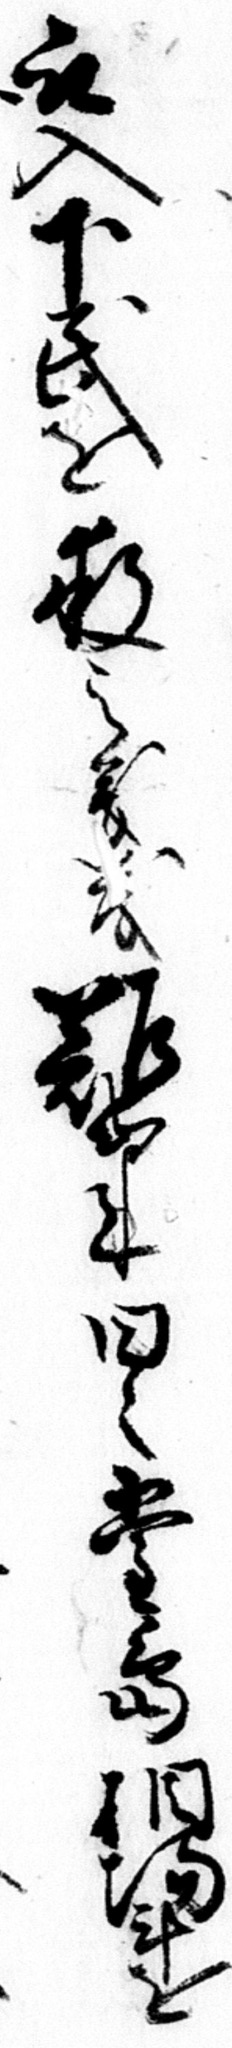取入下民を救之義も難出来日々堂嶋相場計を
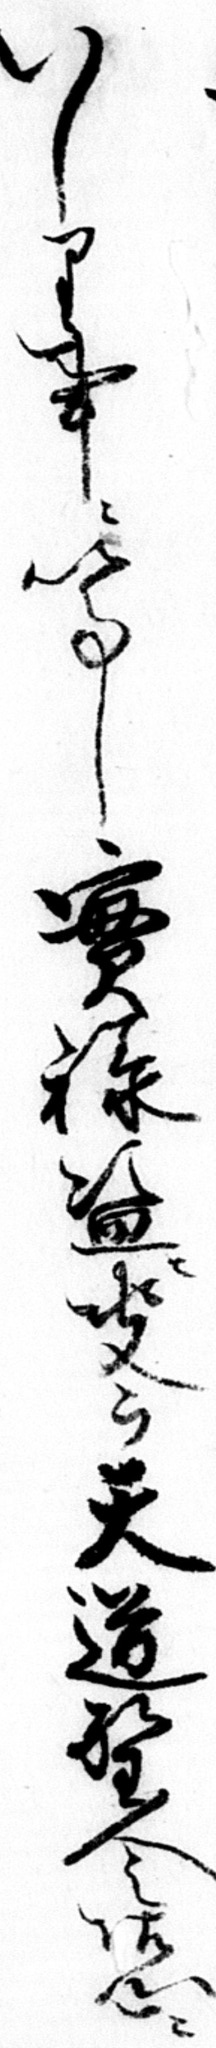いしり事にいたし実禄盗に決而天道聖人之御心に
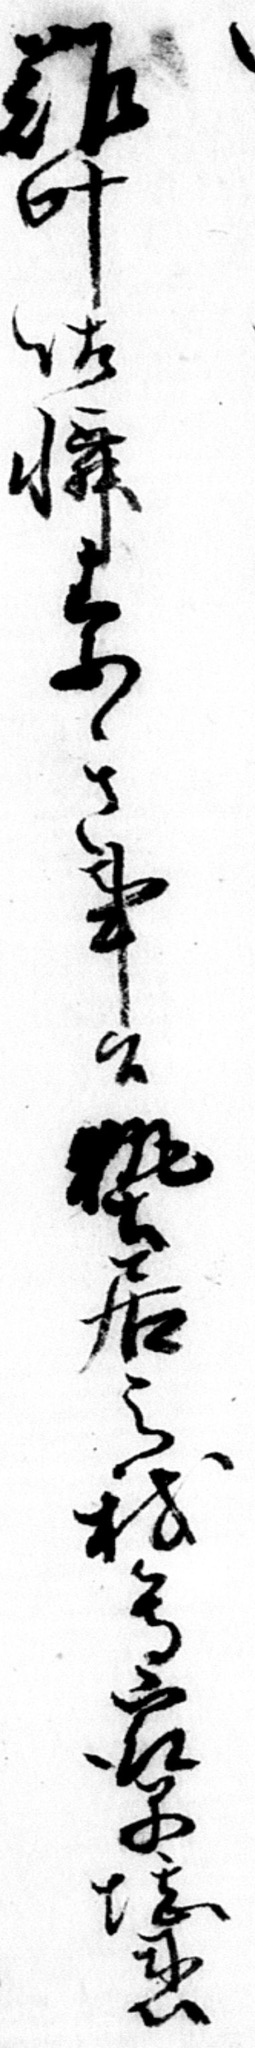難叶御憐なき事候蟄居之我等最早堪忍
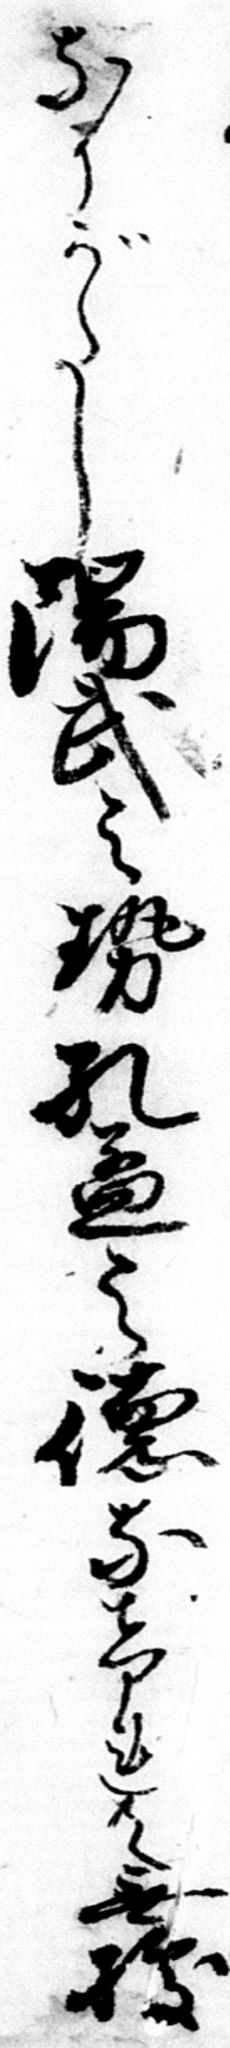なりがたし湯武之勢孔孟之徳なけれ共無拠

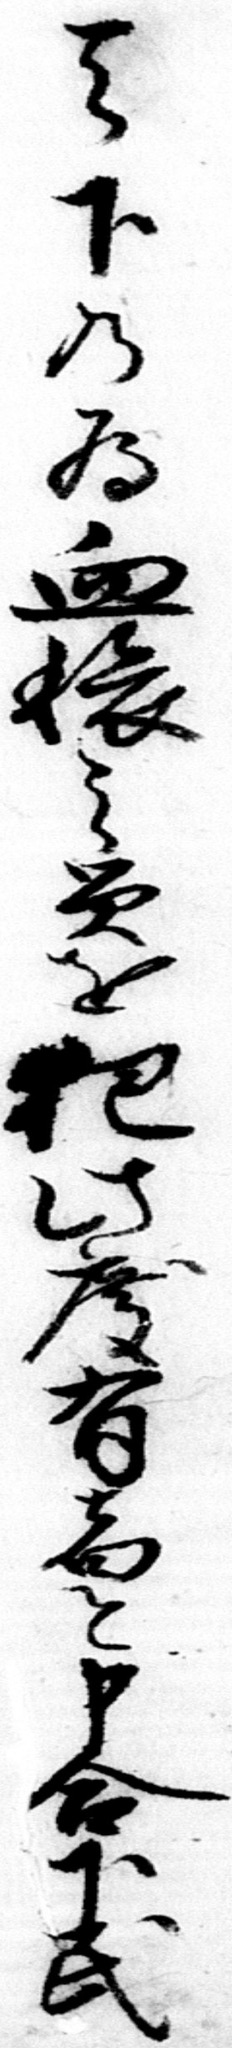天下の為血族之災を犯此度有者と申合下民
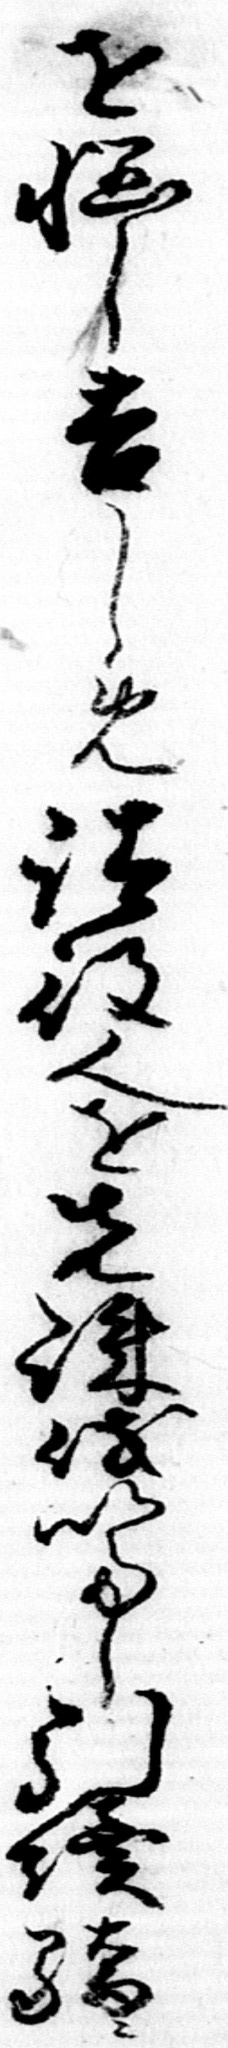を悩し苦しめ諸役人を先誅伐いたし引続驕に
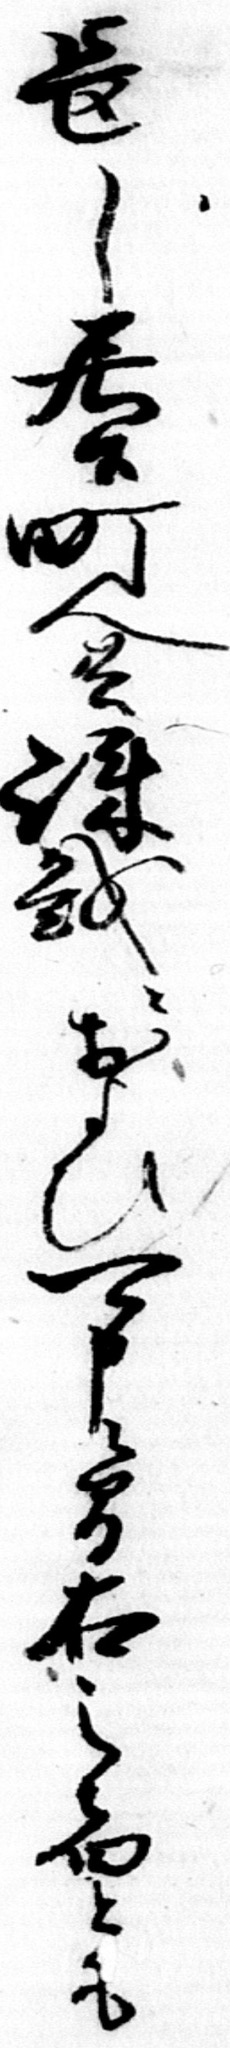長し居候町人共誅戮におよひ可申候間右之者とも
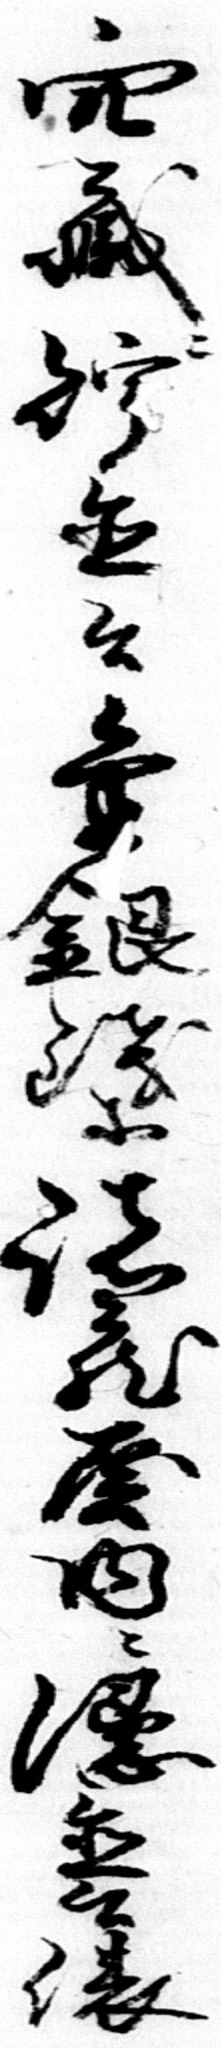穴蔵に貯置候金銀銭等諸蔵屋内に隠置候俵
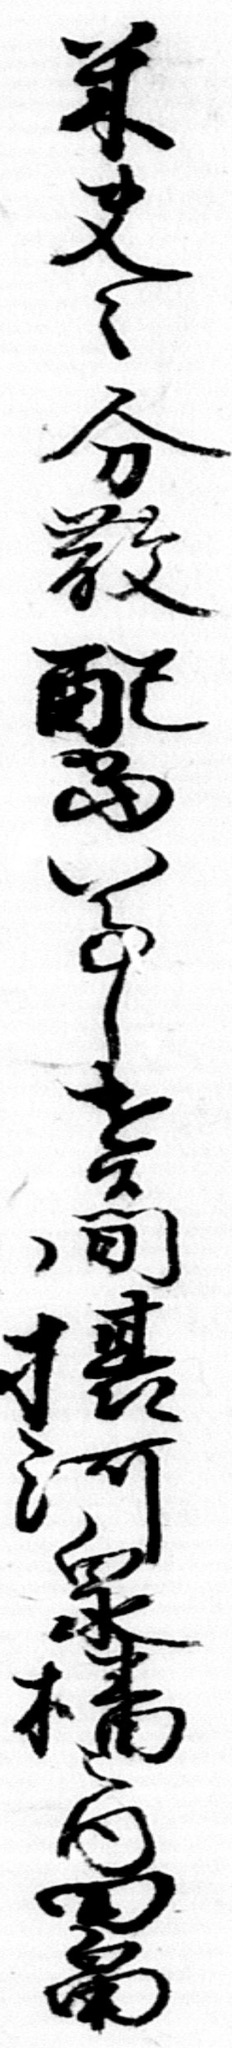米夫々分散配当いたし遣候間摂河泉播之内田畠
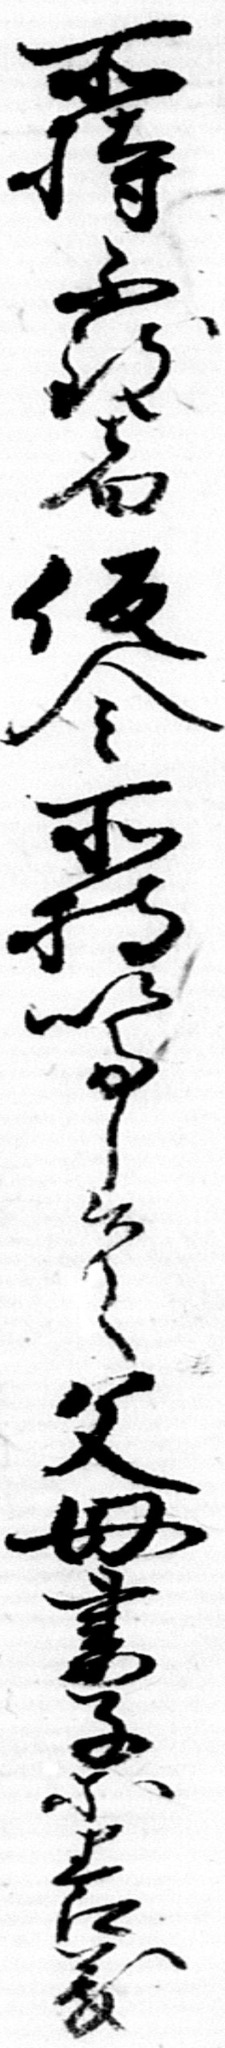所持不致者仮令所持いたし候とも父母妻子等養義
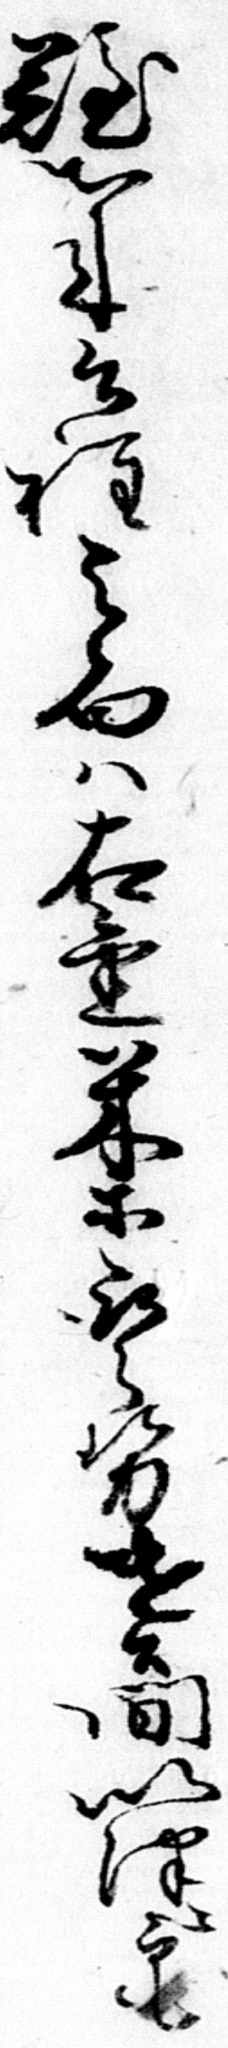難出来候程之者は右金米等取らせ遣候間いつに而も
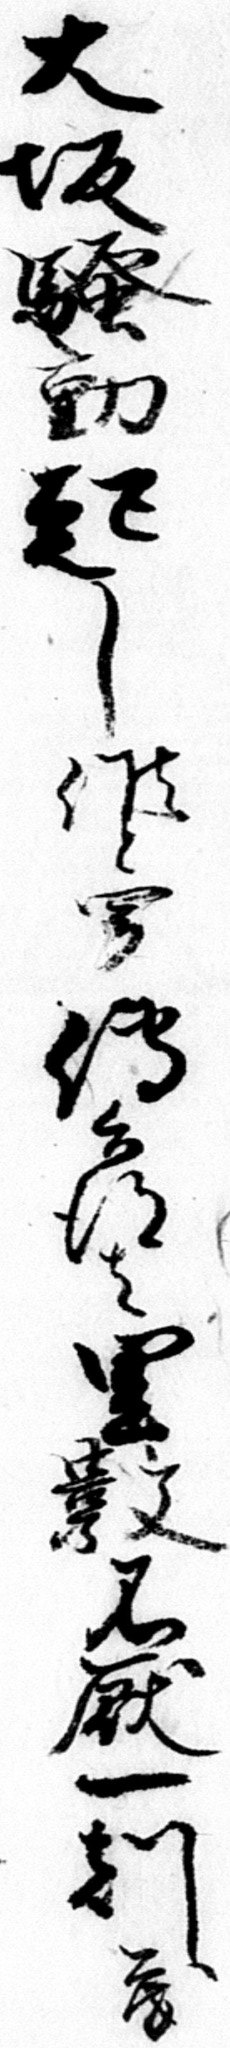大坂騒動起し候と聞伝候得は里数不厭一刻も
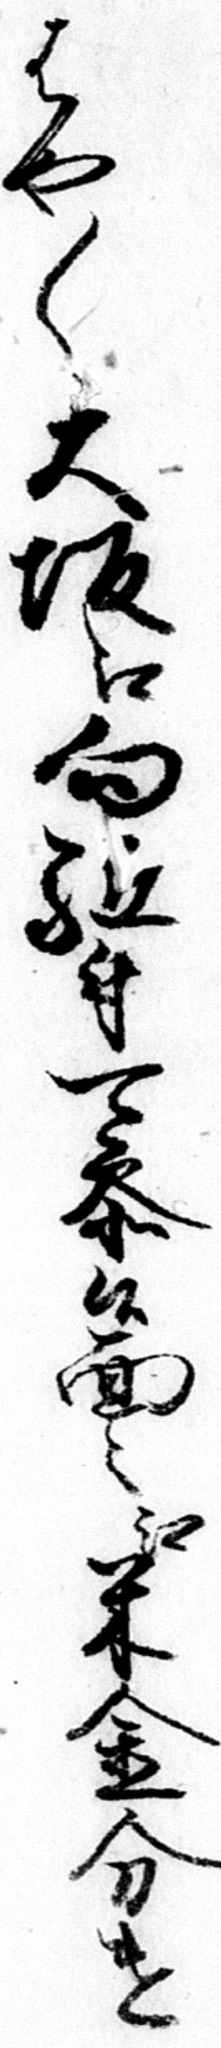はやく大坂え向駆付可参候面々え米金分遣
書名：大坂一件大塩平八郎存書
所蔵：徳島県立図書館
